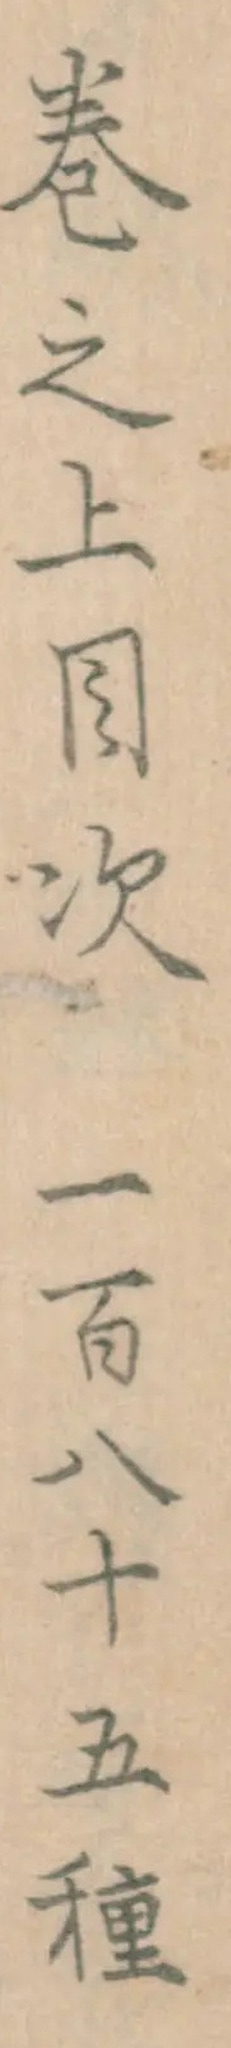巻之目次一百八十五種
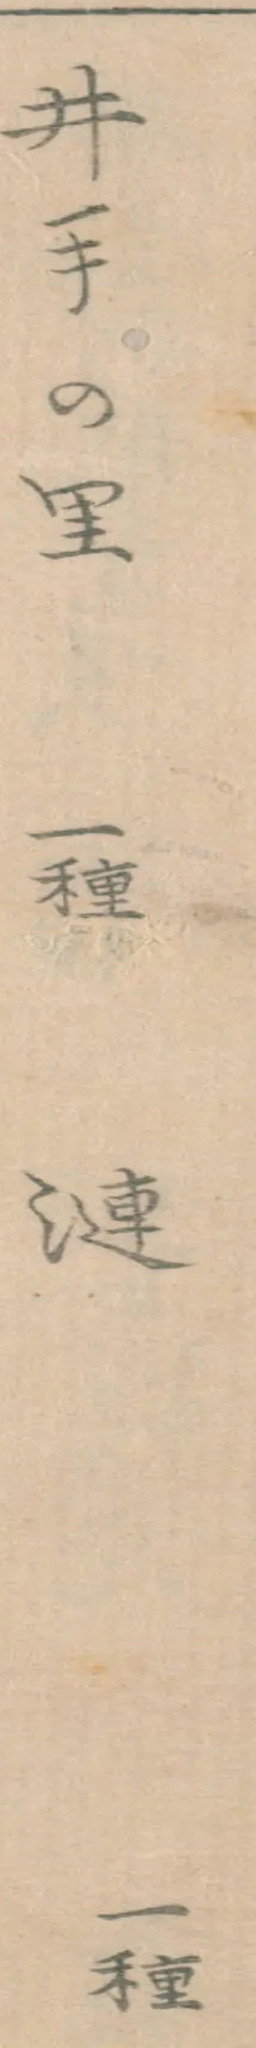井出の里一種漣一種
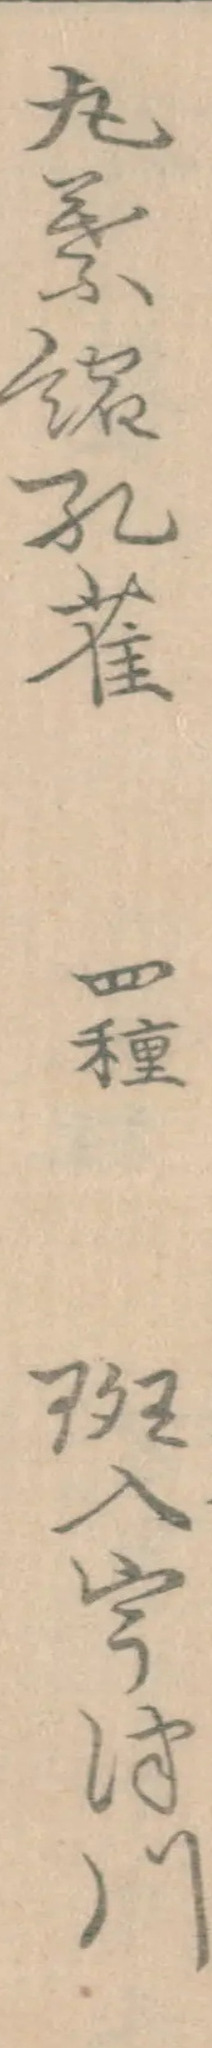丸葉縮孔雀四種斑入宇津川一種
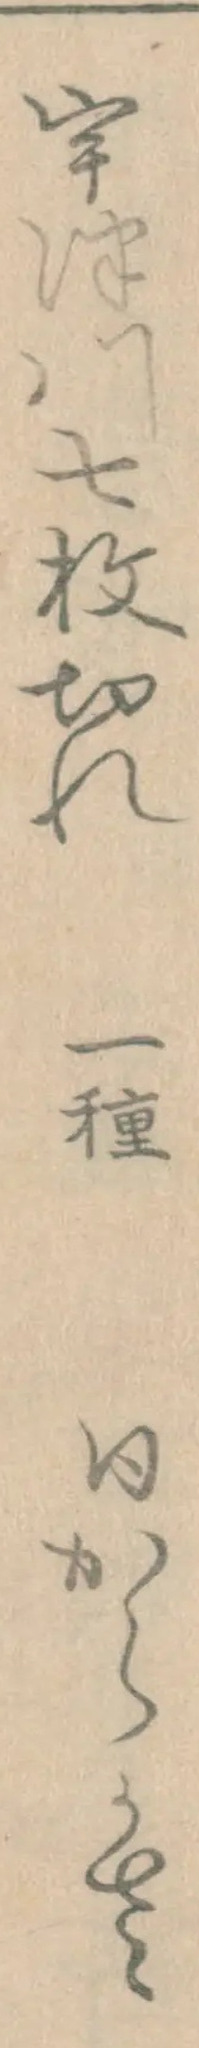宇津川七枚切れ一種日からかさ一種

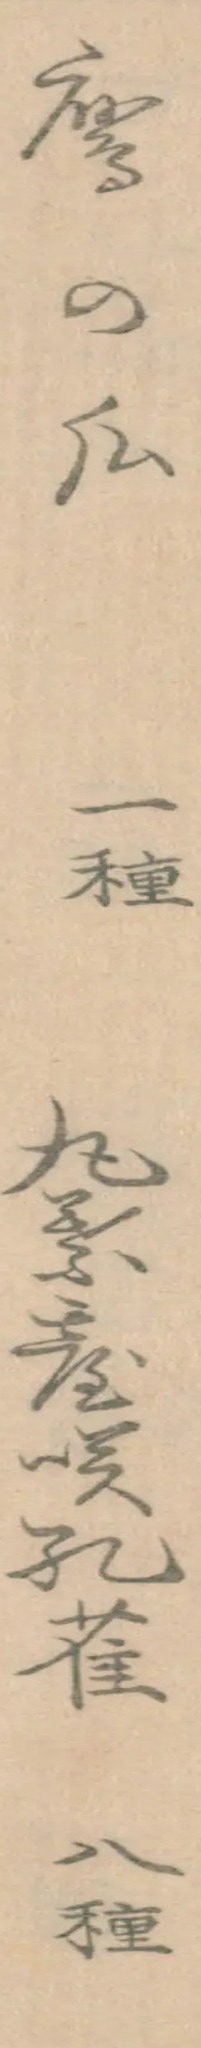鷹の爪一種丸葉台咲孔雀一種
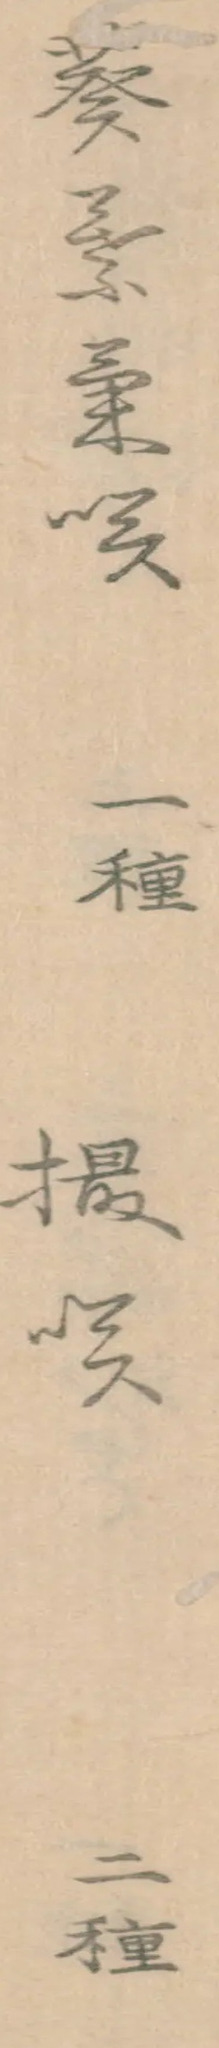葵葉菊咲一種撮咲一種
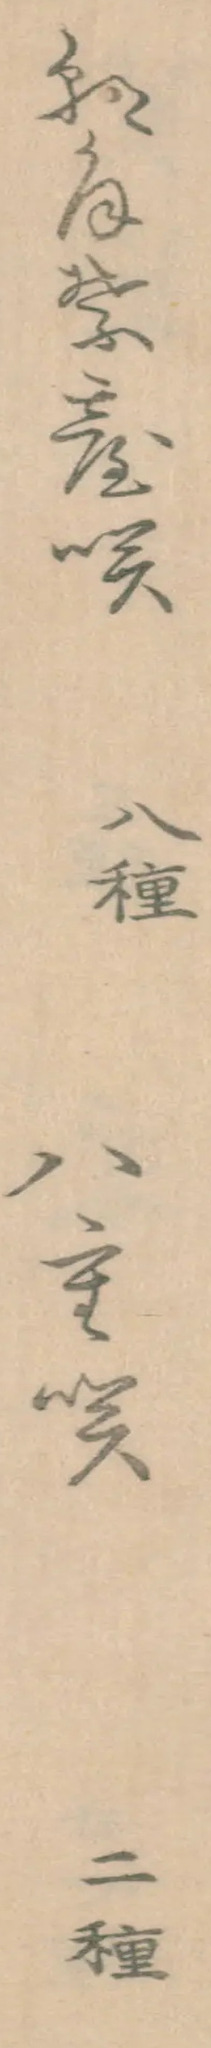朝かほ葉台咲八種八重咲二種
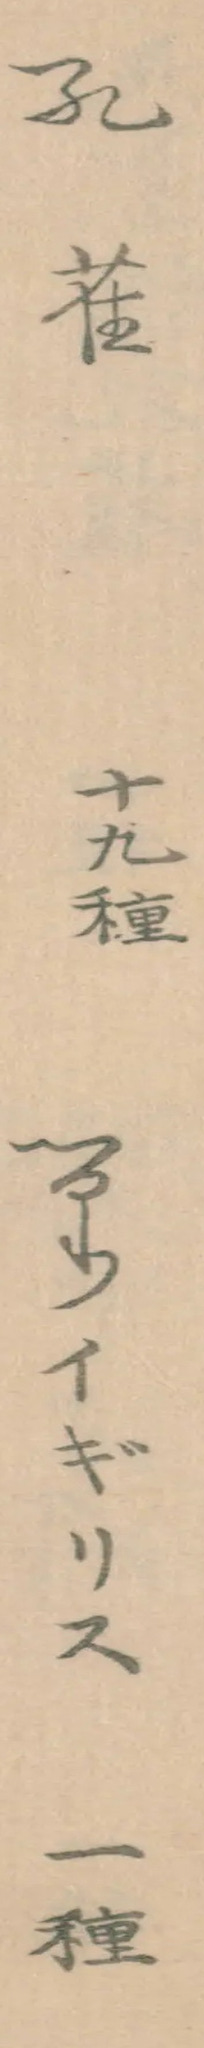孔雀十九種るりイギリス一種
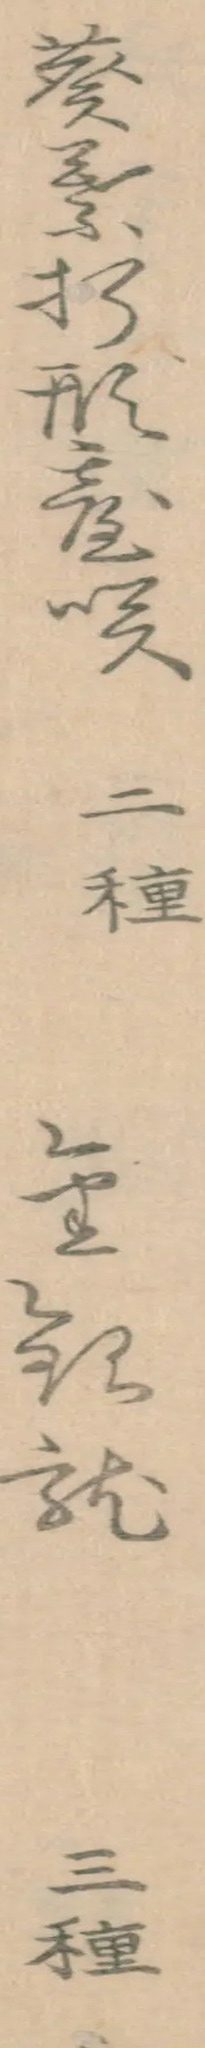葵葉折形台咲二種金銀龍三種
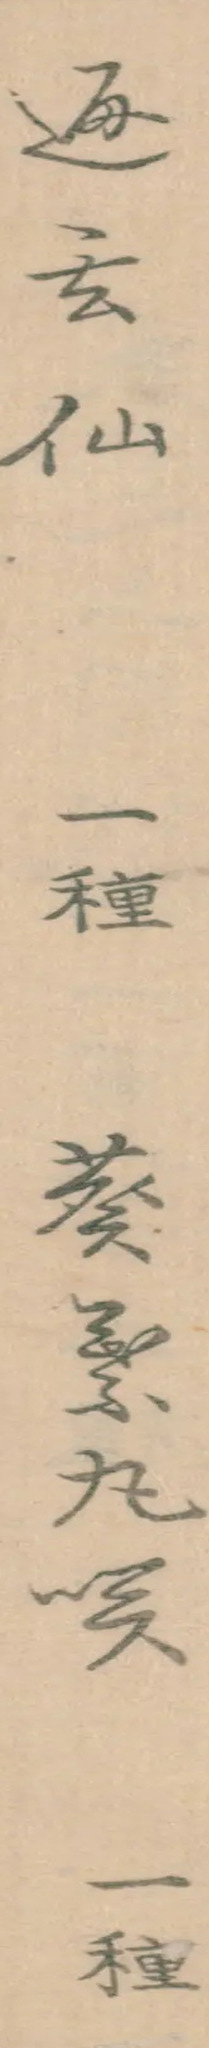通玄仙一種葵葉丸咲一種
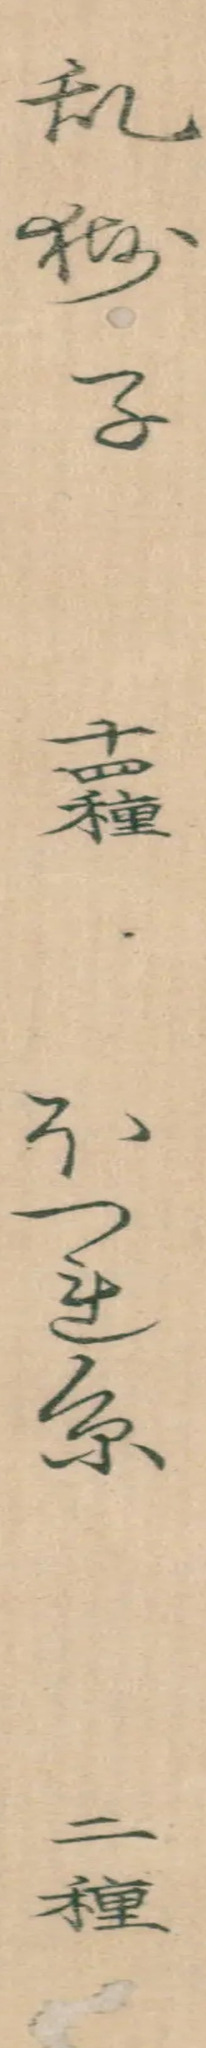乱獅子十四種ほつれ糸二種
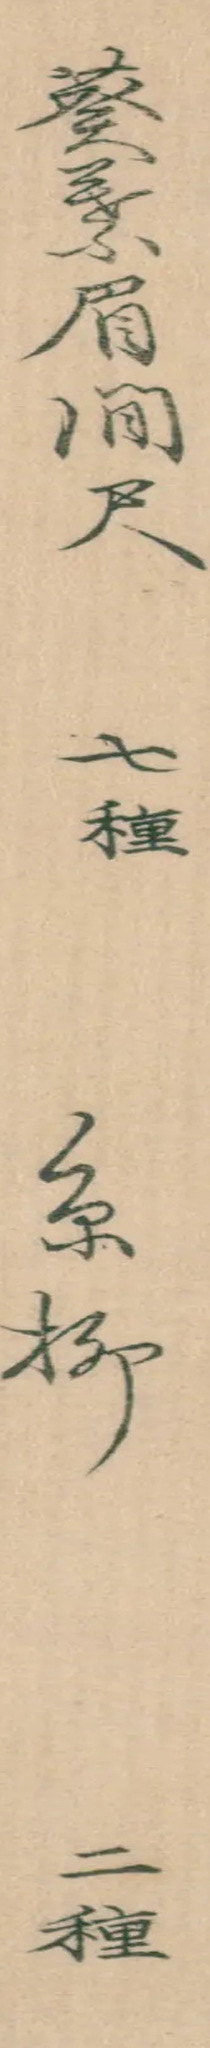葵葉眉間尺七種糸柳二種
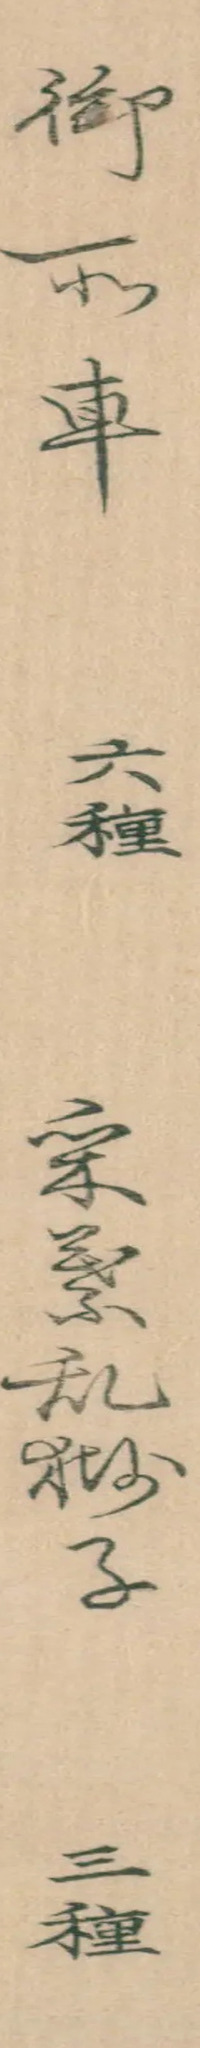御所車六種采葉乱獅子三種
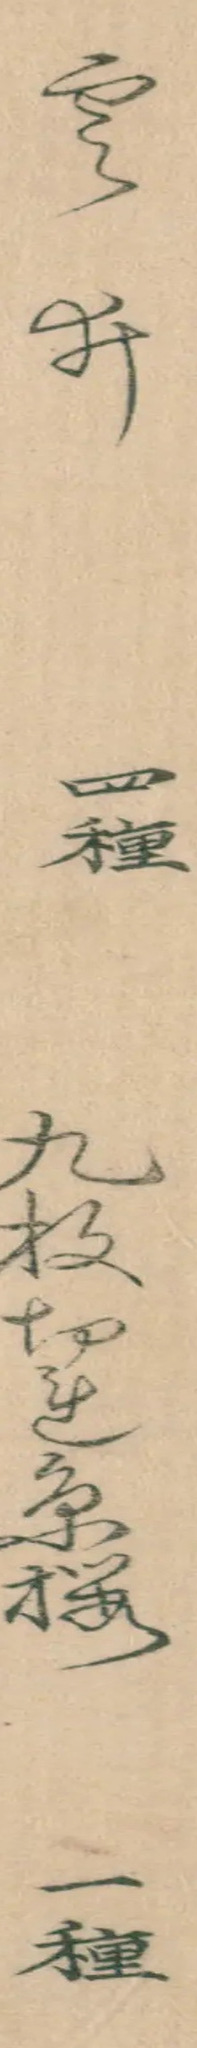雲井四種九枚切れ糸桜一種
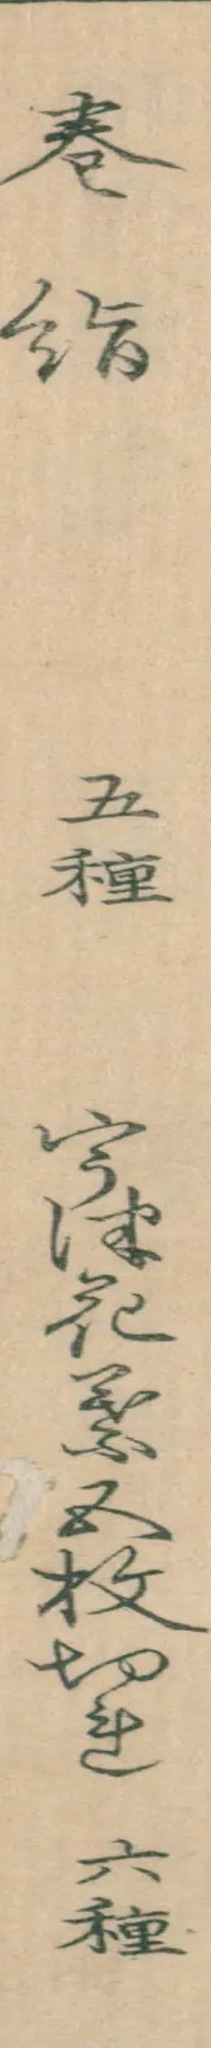巻絹五種宇津花葉五枚切れ六種

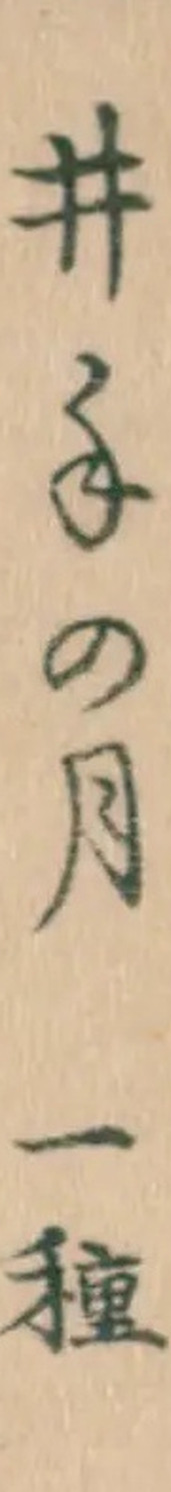井手の月一種
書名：朝顔叢. 上巻
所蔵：国立国会図書館 National Diet Library, JAPAN
